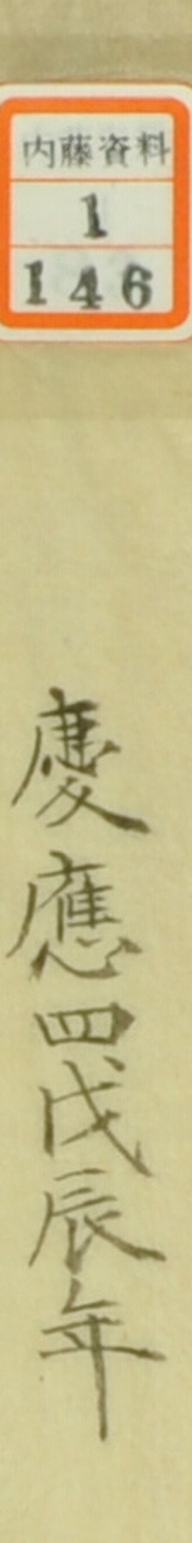慶應四戊辰年
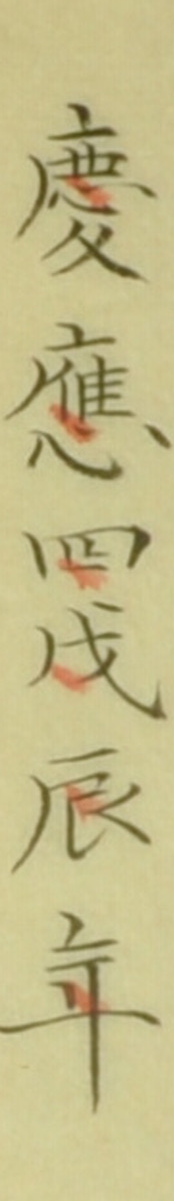慶應四戊辰年
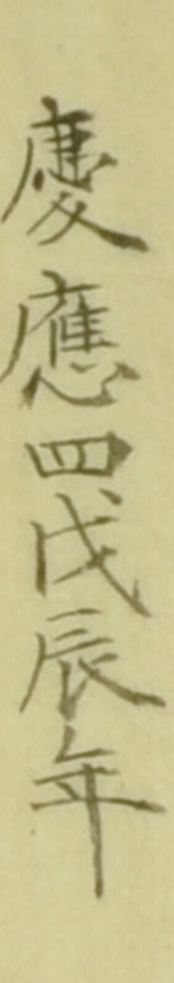慶應四戊辰年
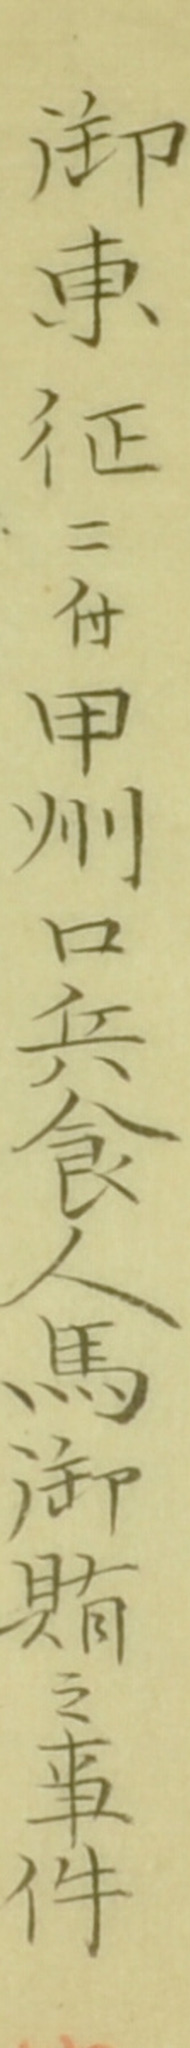御東征ニ付甲州口兵食人馬御賄之事件控
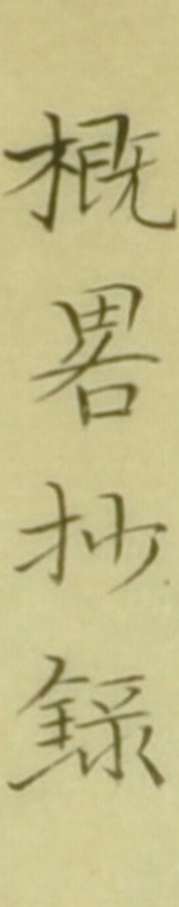概略抄録

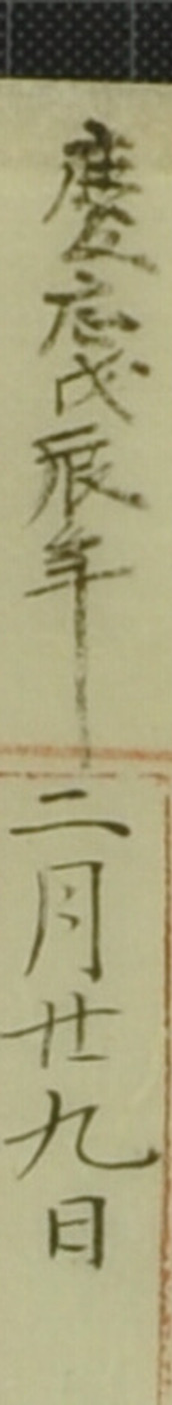慶応戊辰年二月廿九日
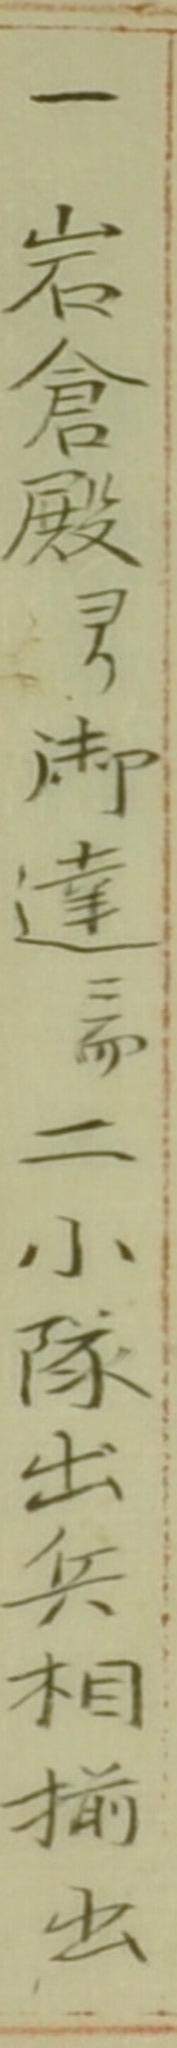一岩倉殿ヨリ御達ニ而二小隊出兵相揃出
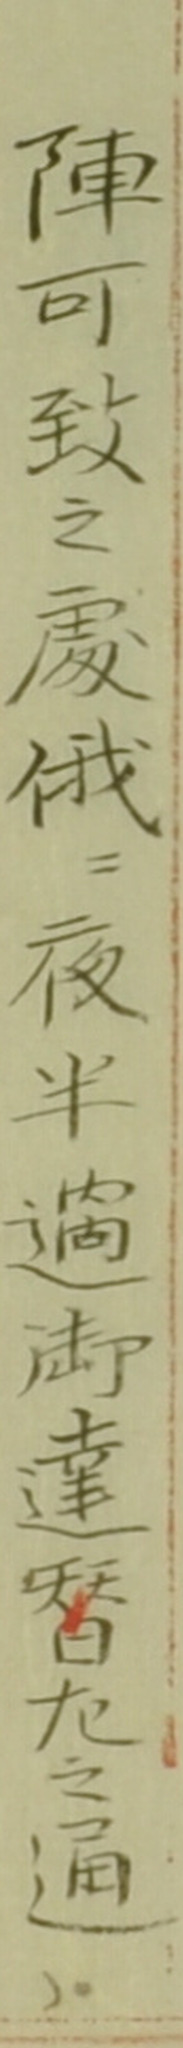陣可致之処俄ニ夜半過御達替左之通
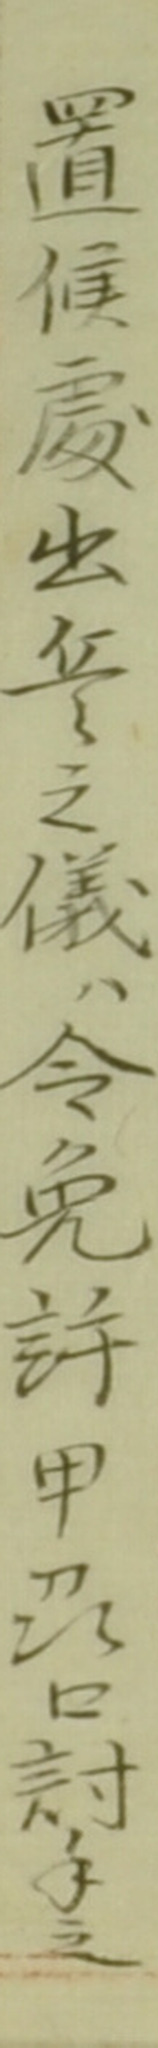置候出兵之儀ハ令免許甲州口討手之
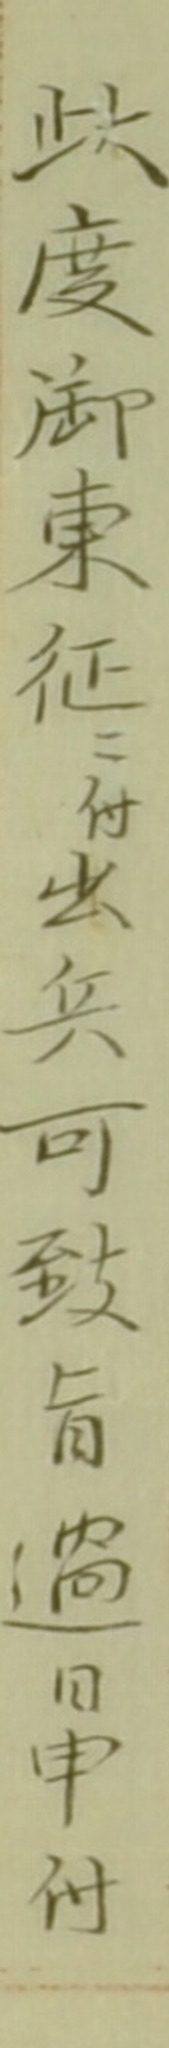此度御東征ニ付出兵可致旨過日申付
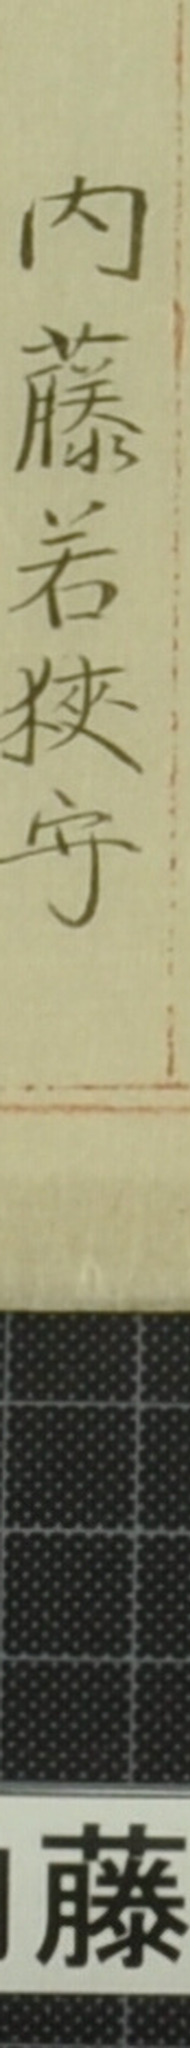内藤若狭守
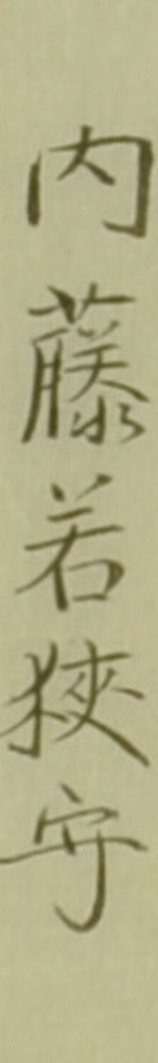内藤若狭守
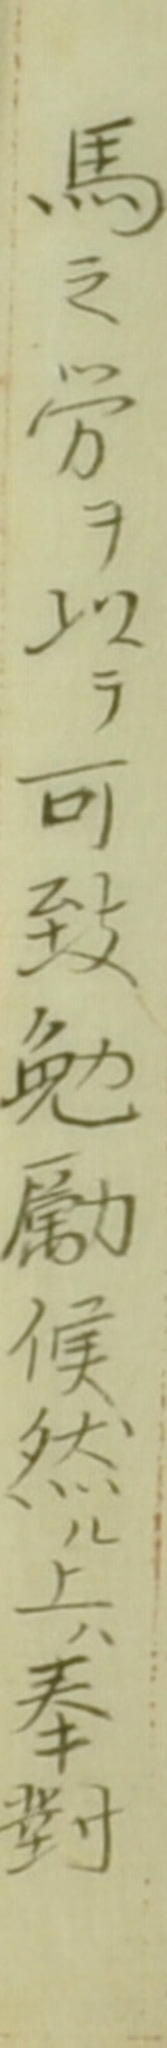馬之労ヲ以テ可致努勉励候然ル上ハ奉対
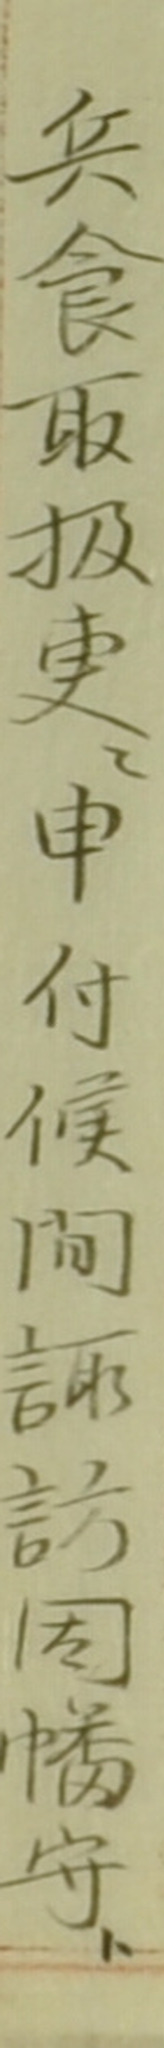兵食取扱更に申付候間諏訪因幡守ト
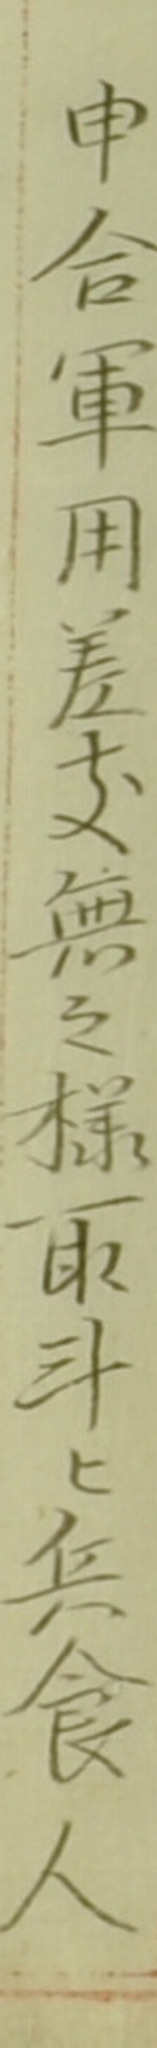申合軍用差支無之様取計ヒ兵食人

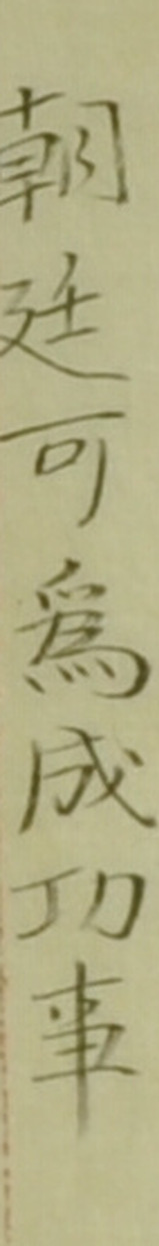朝廷可為成功事
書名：御東征ニ付甲州口兵食人馬御賄之事件（控）
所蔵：伊那市立高遠町図書館・合同会社AMANE
